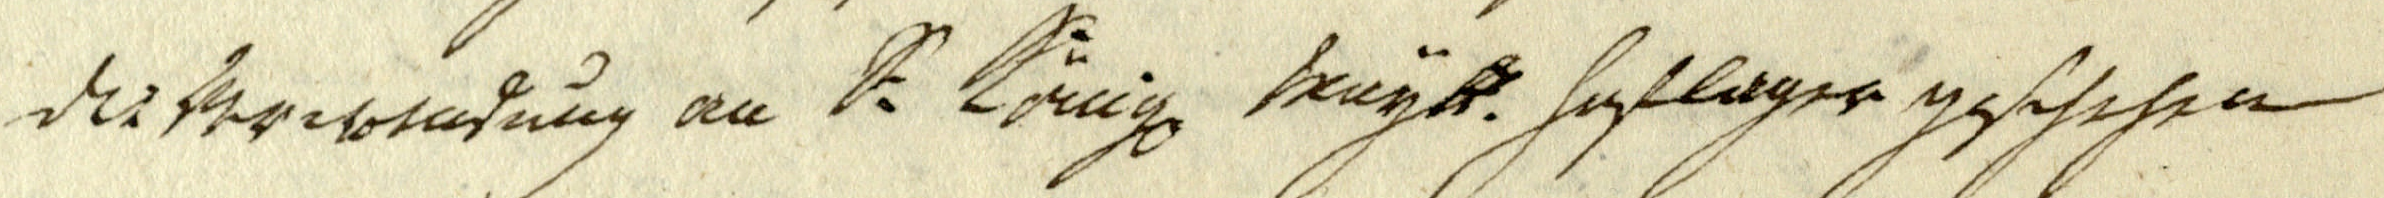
die Verwendung an Sr. Königl. Maÿtt. hoflager geschehen
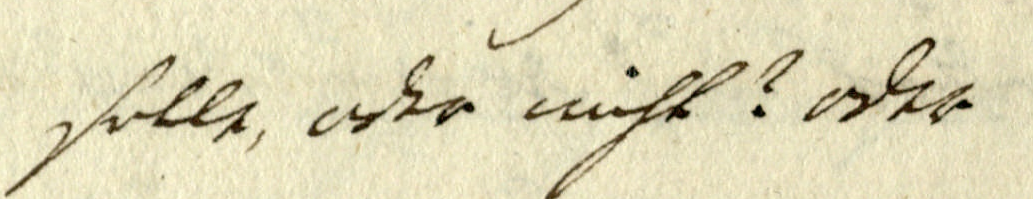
solle, oder nicht? oder
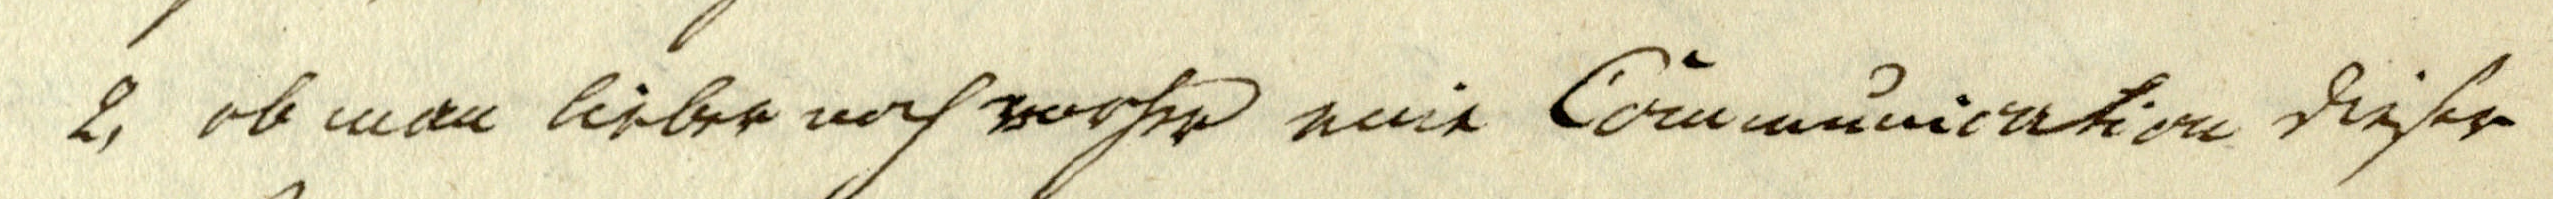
2, ob man lieber noch vorher eine Communication dieser
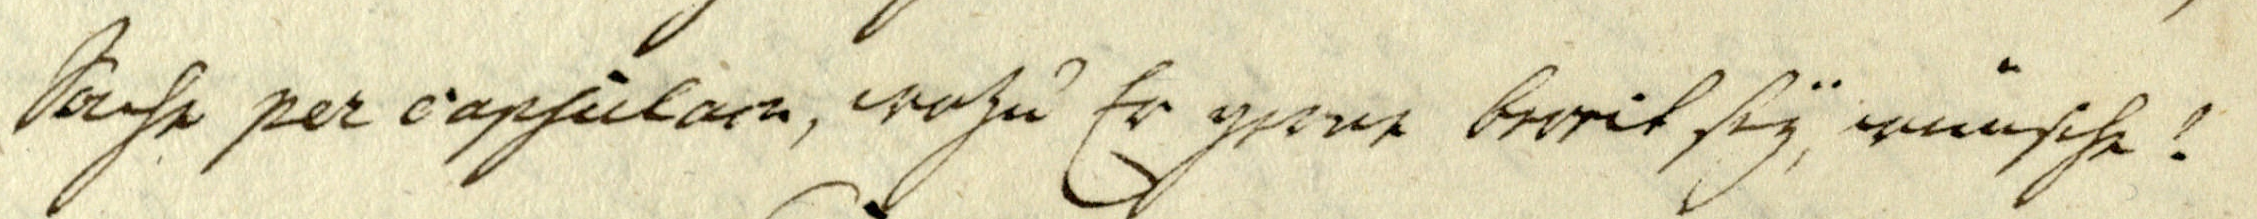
Sache per capsulam, wozu Er gerne bereit seÿ, wünsche?
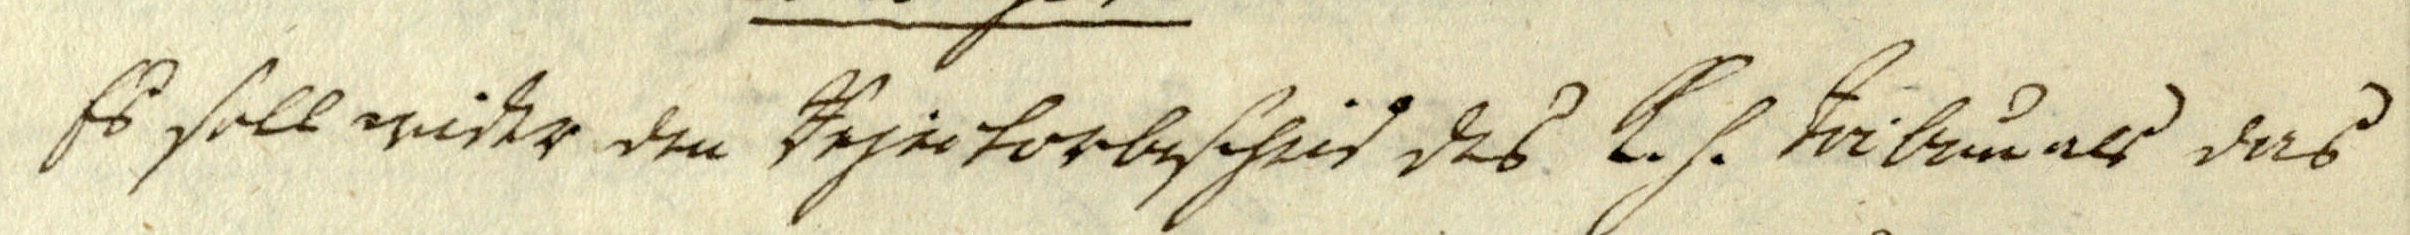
Es soll wider den Rejectorbescheid des K. h. Tribunals das
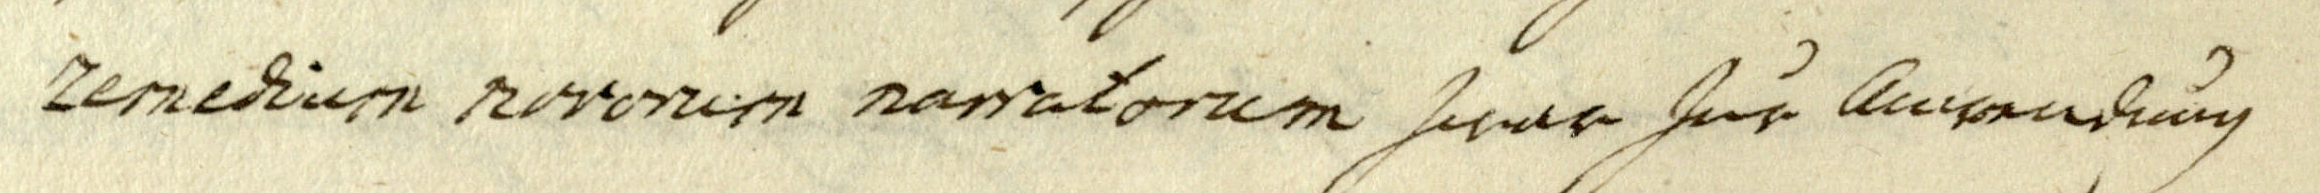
remedium novorum narratorum zwar zur Anwendung
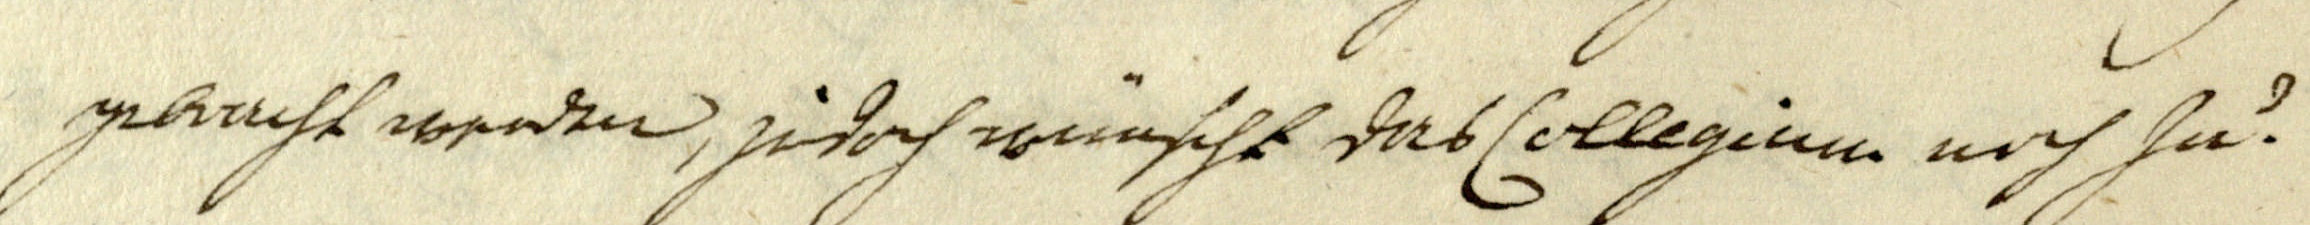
gebracht werden, jedoch wünscht das Collegium noch zu¬
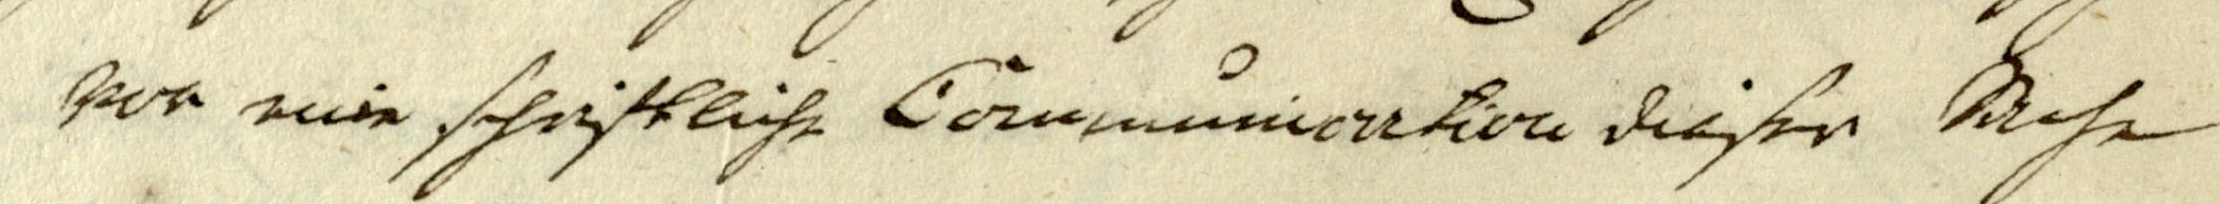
vor eine schriftliche Communication dieser Sache
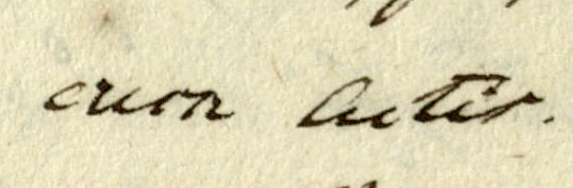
cum Actis.
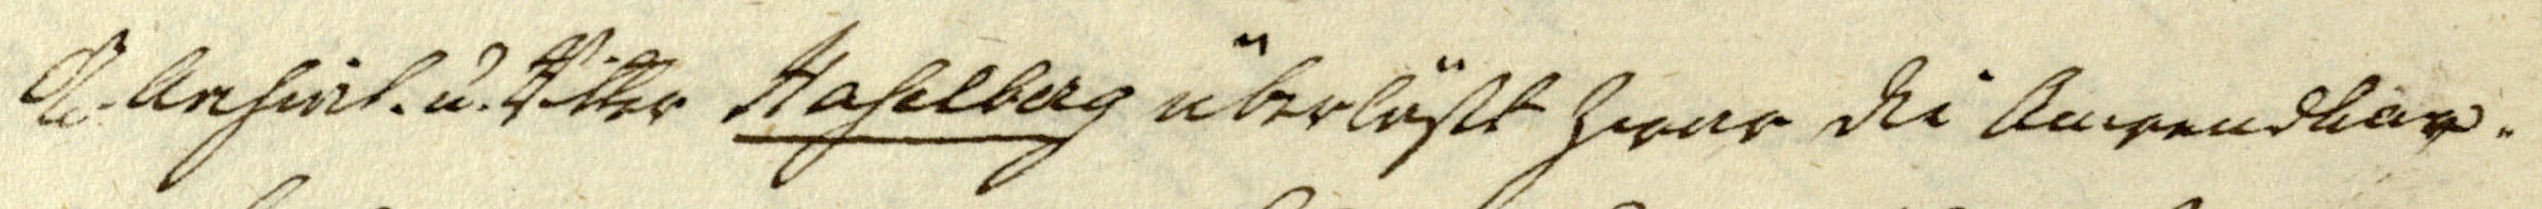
dh. Archiat. u. Ritter Haselberg überläßt zwar die Anwendbar¬
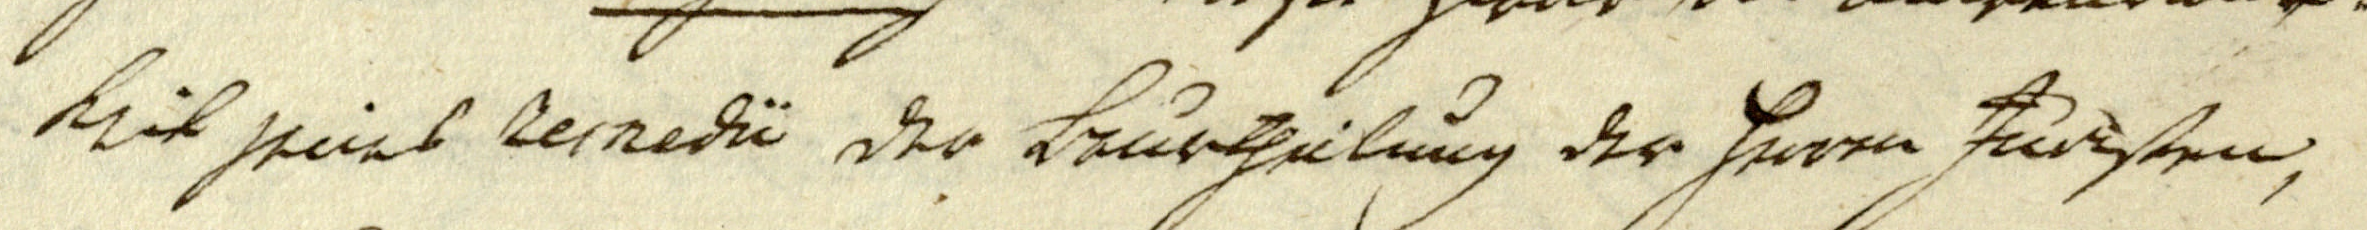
keit jenes remedii der Beurtheilung der Herren Juristen,
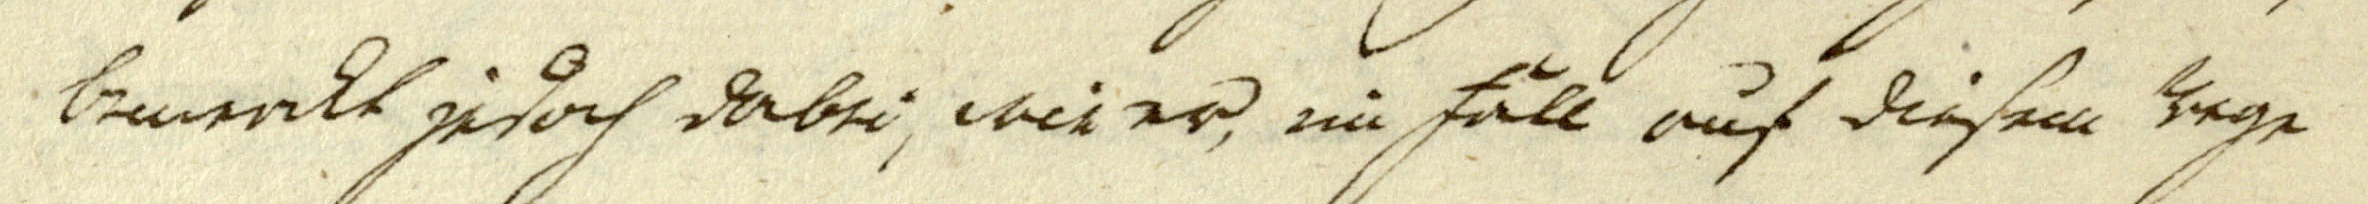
bemerckt jedoch dabei, wie er, im Fall auf diesem Wege
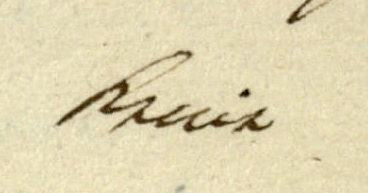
keine
